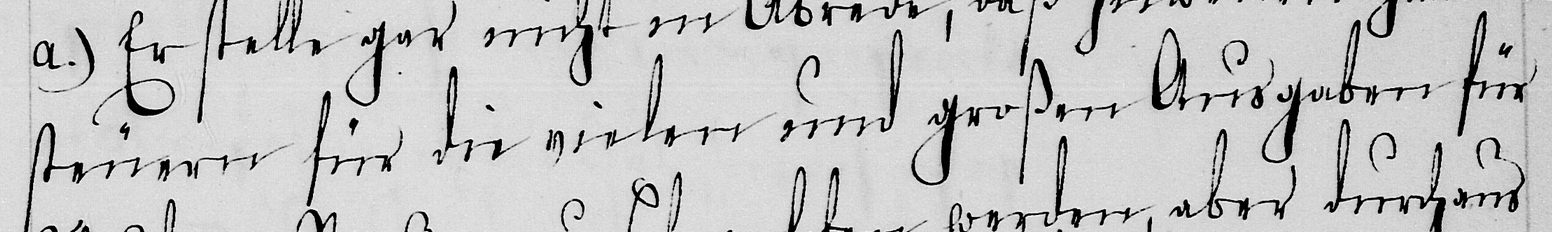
steuern für die vielen und großen Ausgaben für
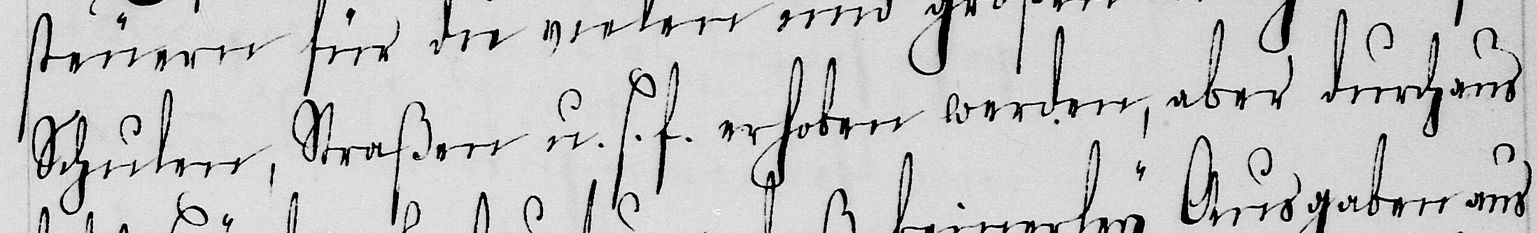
Schulen, Straßen u. s. f. erhoben werden, aber durchaus
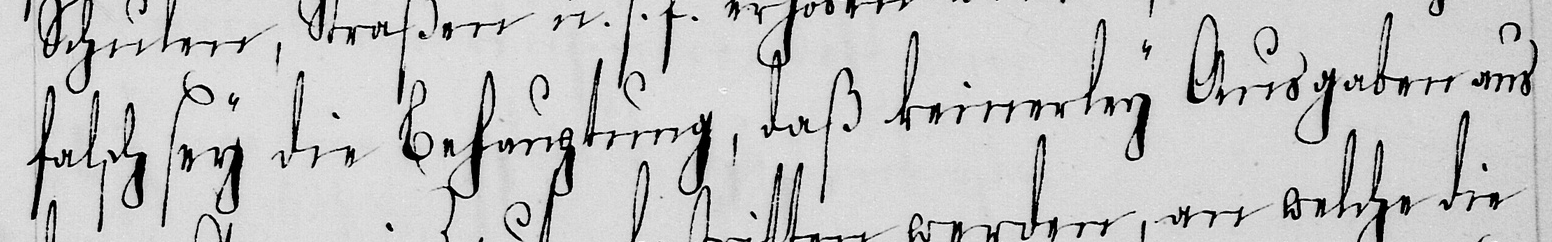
falsch sey die Behauptung, daß keinerley Ausgaben aus
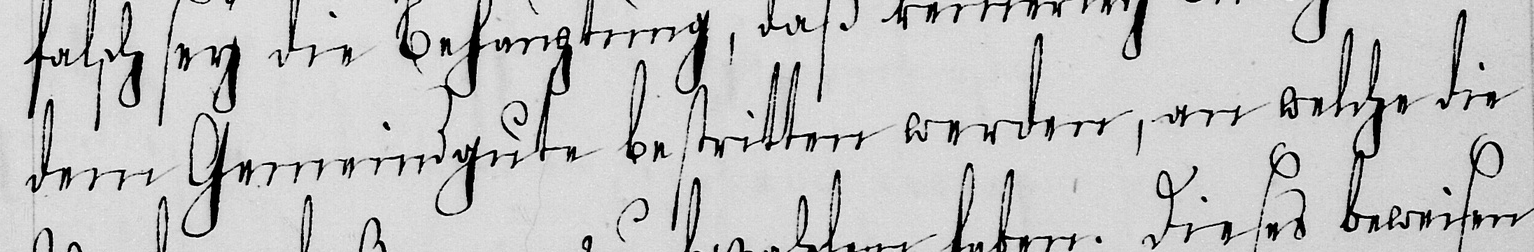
dem Gemeindgute bestritten werden, an welche die
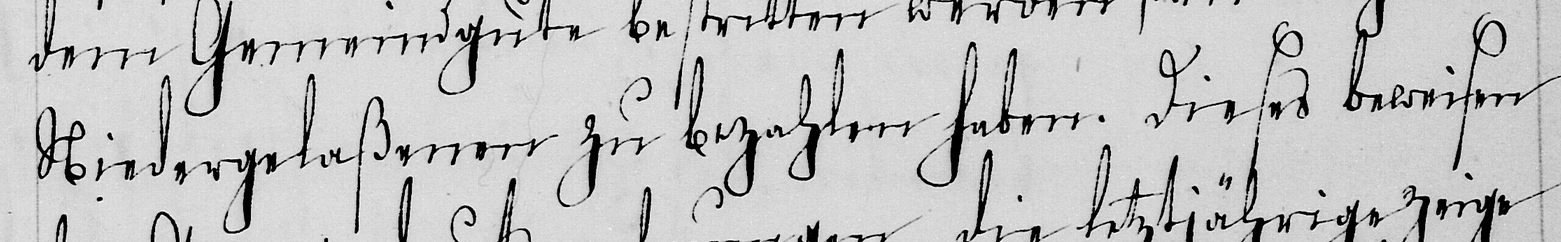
Niedergelaßenen zu bezahlen haben. Dieses beweisen
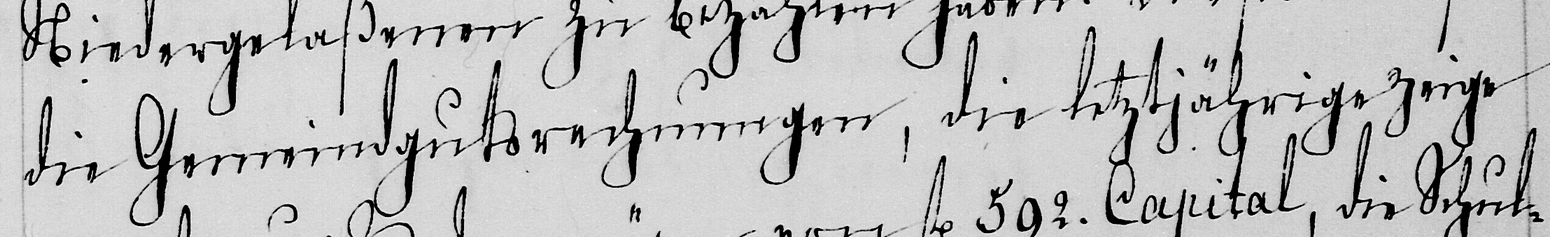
die Gemeindgutsrechnungen, die letztjährige zeige
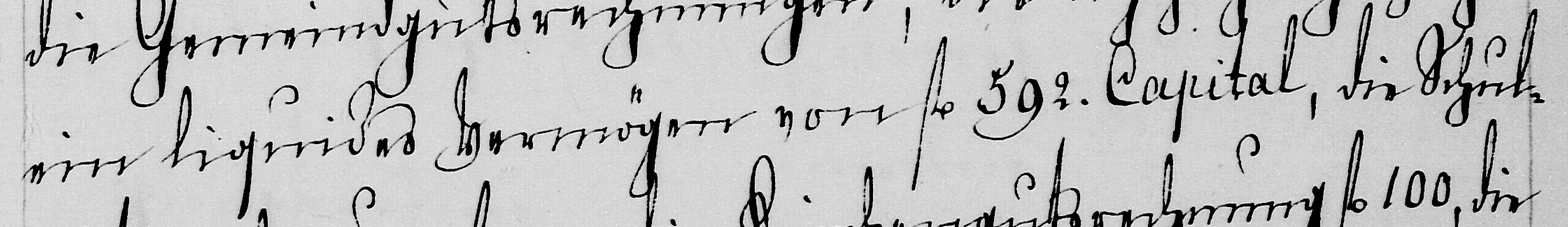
ein liquides Vermögen von fl. 592. Capital, die Schul¬
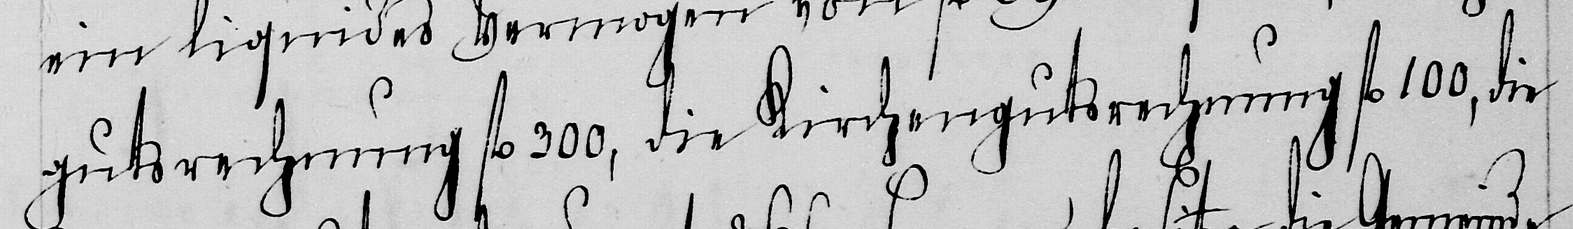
gutsrechnung fl. 300, die Kirchengutsrechnung fl. 100, die
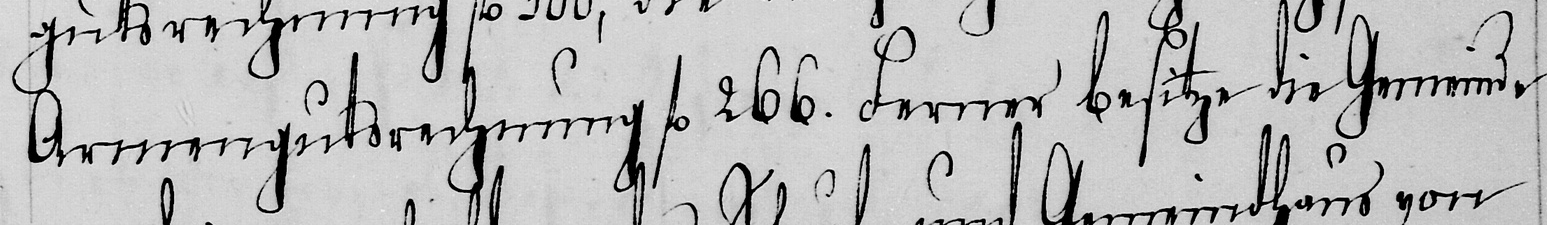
Armengutsrechnung fl. 266. Ferner besitze die Gemeinde
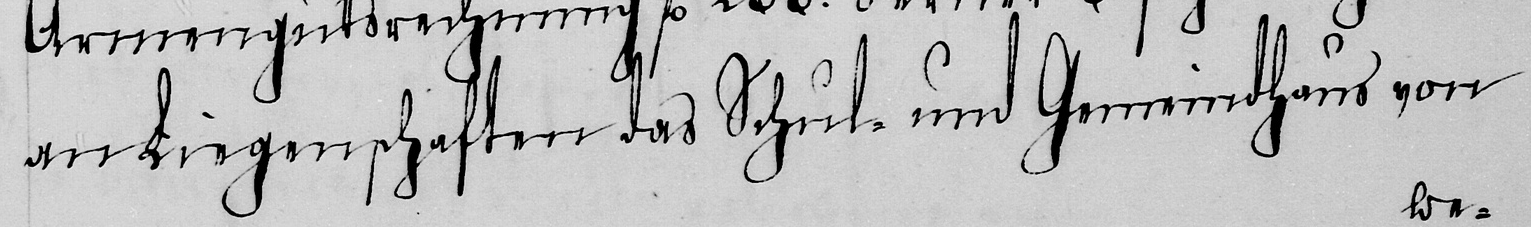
an Liegenschaften das Schul- und Gemeindhaus von
